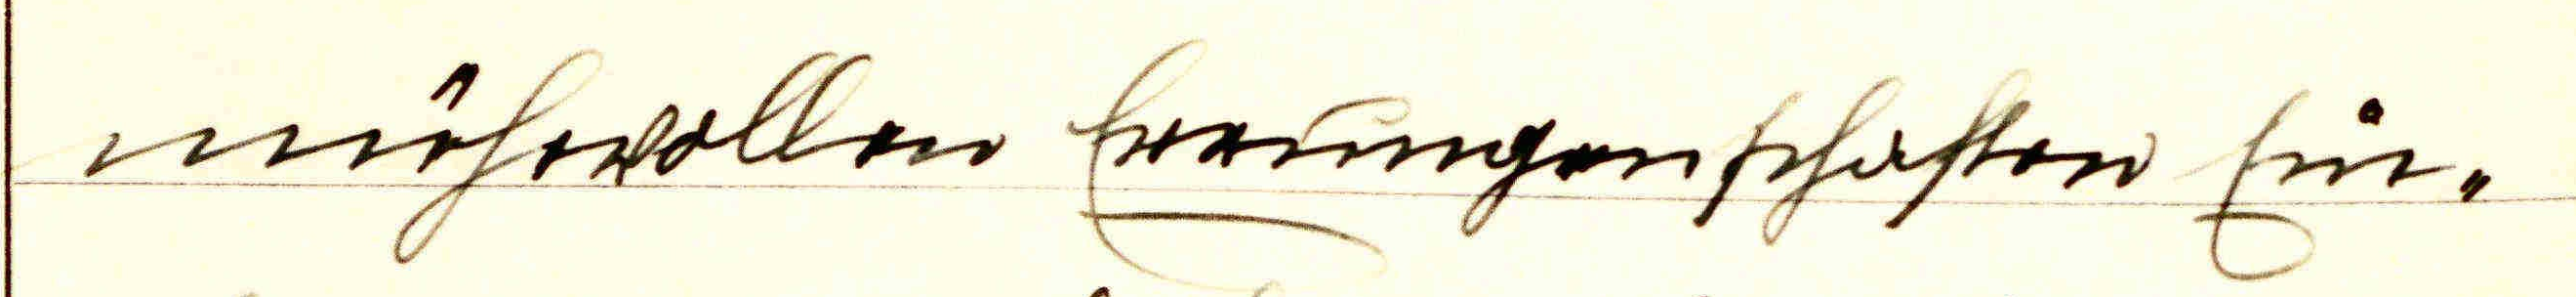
mühevollen Errungenschaften Ein-
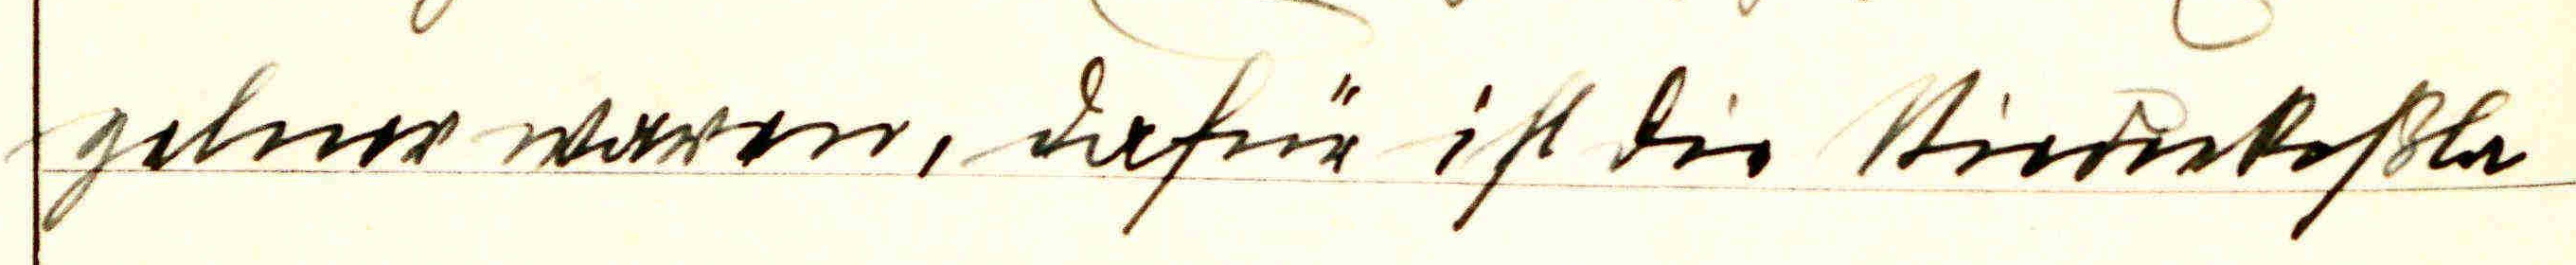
zelner waren, dafür ist die Niederkeßla
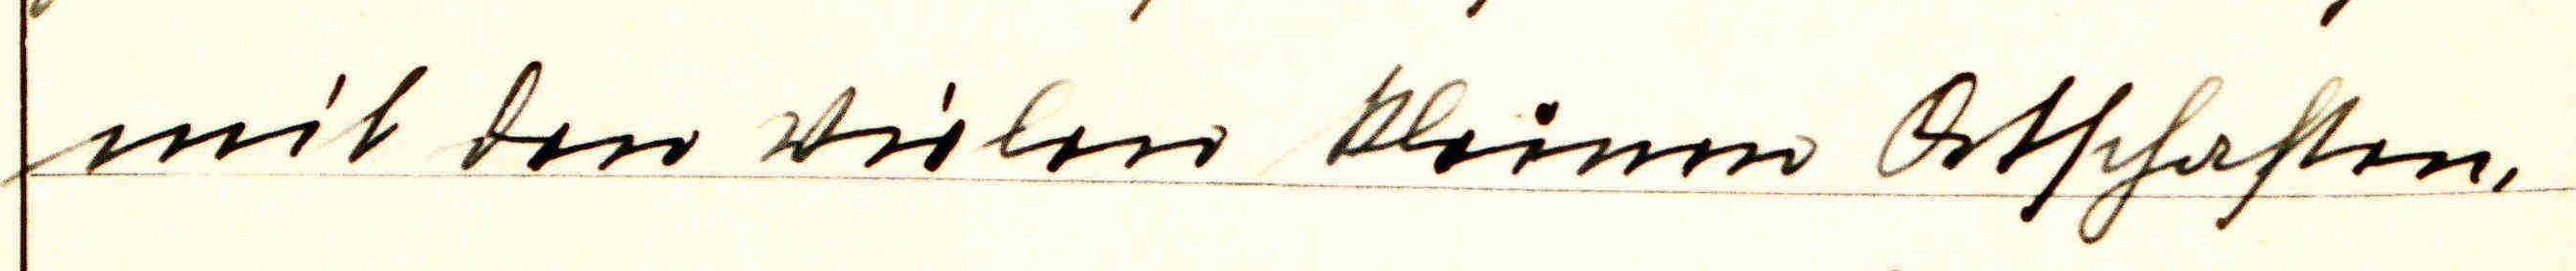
mit den vielen kleinen Ortschaften.
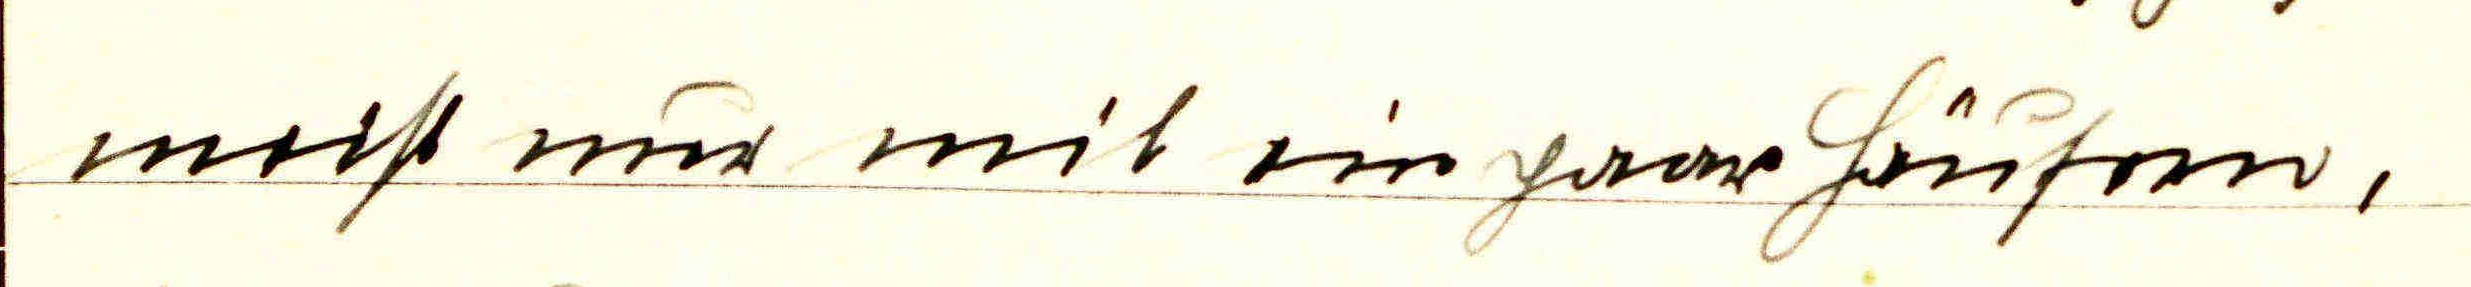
meist nur mit ein paar Häusern,
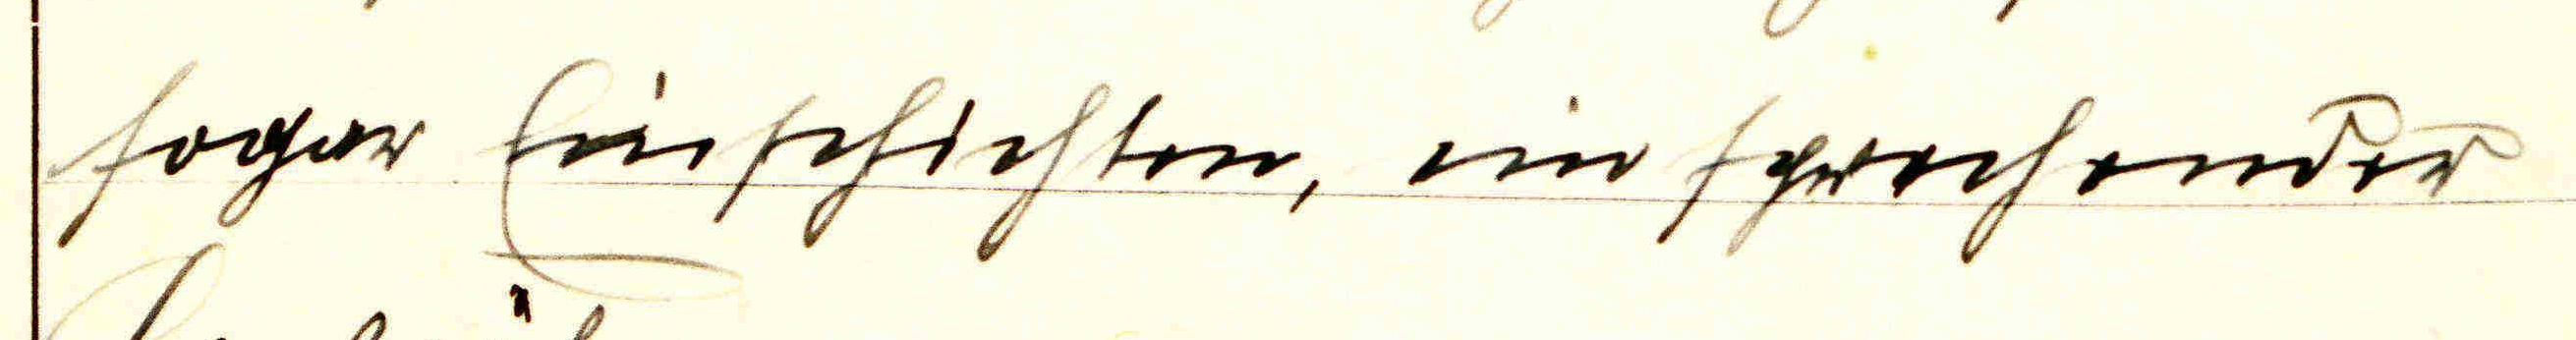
sogar Einschichten, ein sprechender
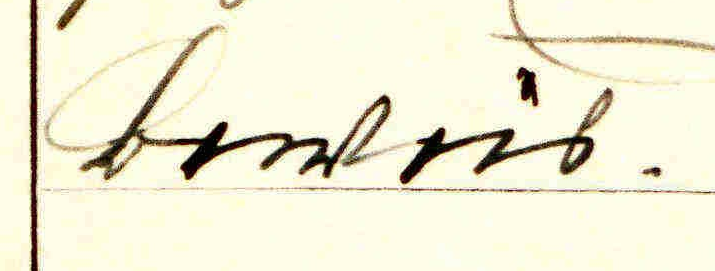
Beweis.
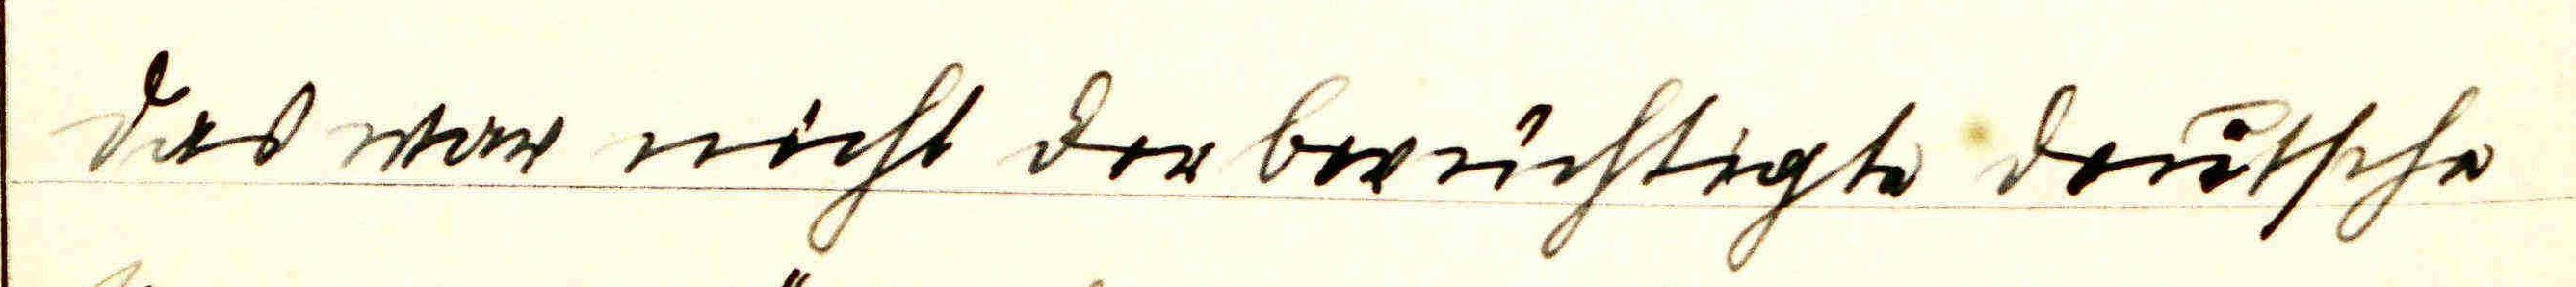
Das war nicht der berüchtigte deutsche
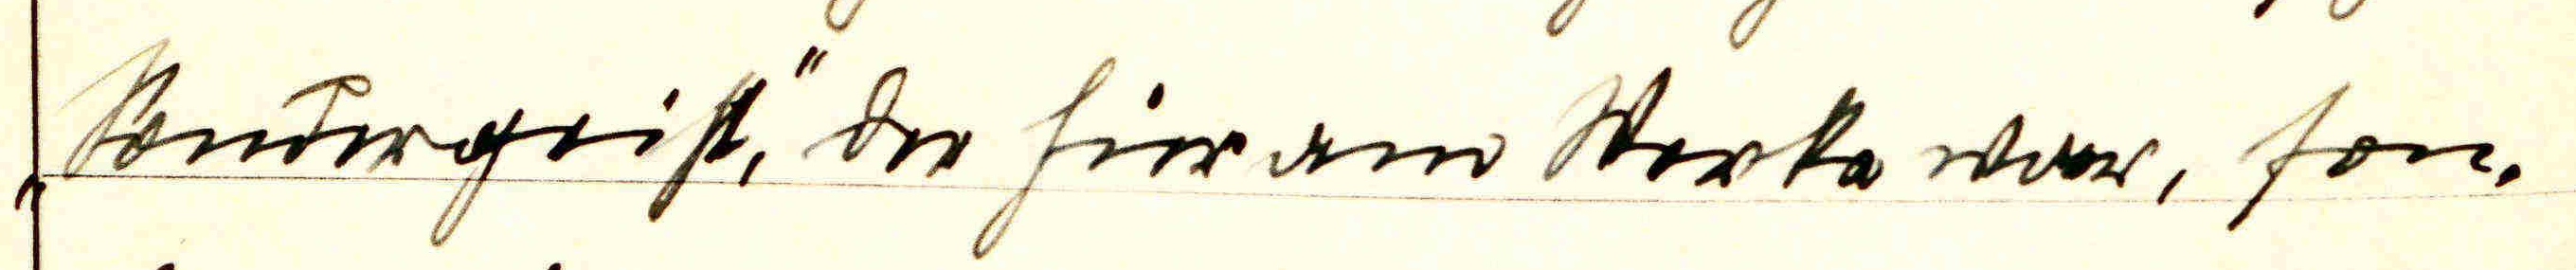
"Sondergreiß", der hier am Werke war, son-
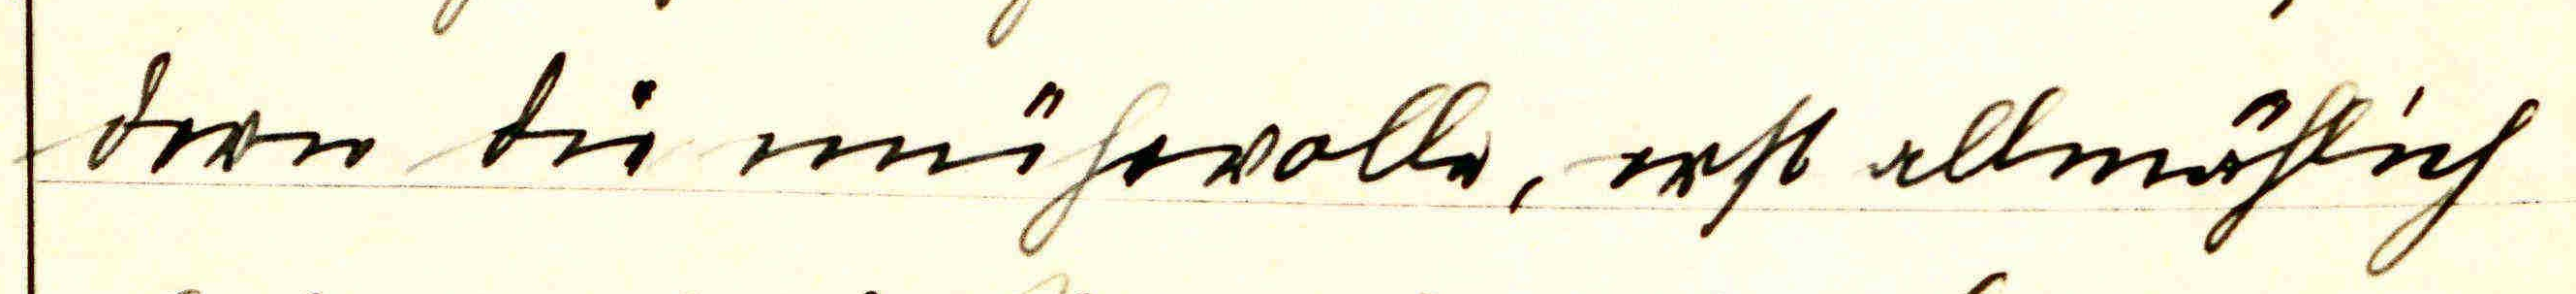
dern die mühevolle, erst allmählich
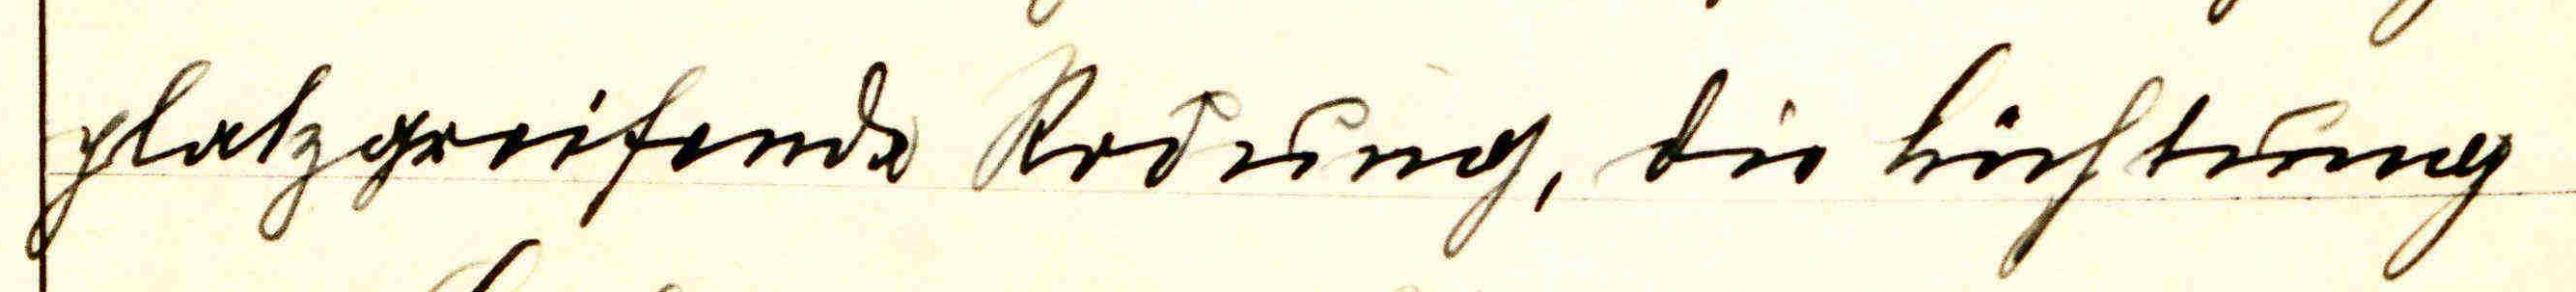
platzgreifende Rodung, die Lichtung
